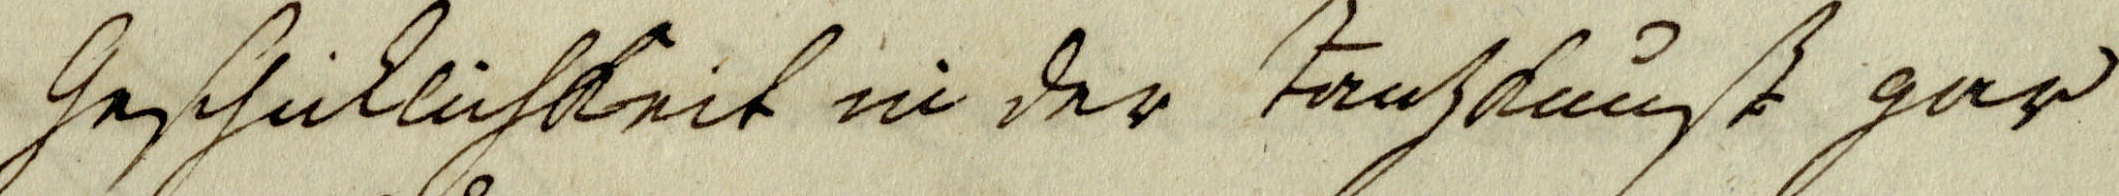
Geschicklichkeit in der Tanzkunst gar
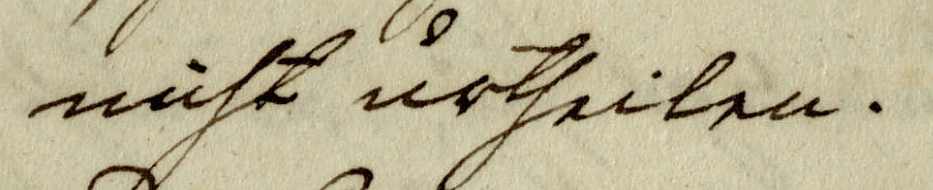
nicht urtheilen.
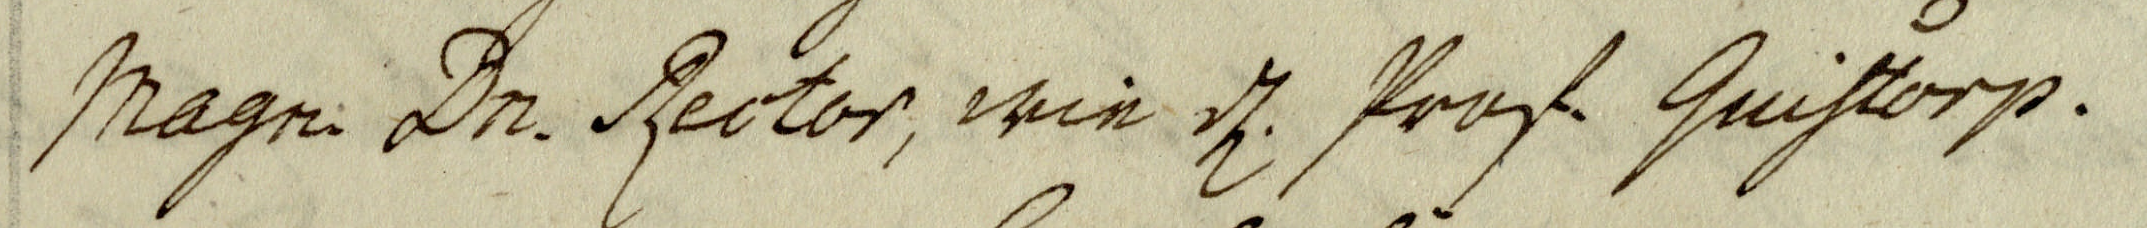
Magn. Dn. Rector, wie dh. Prof. Quistorp.
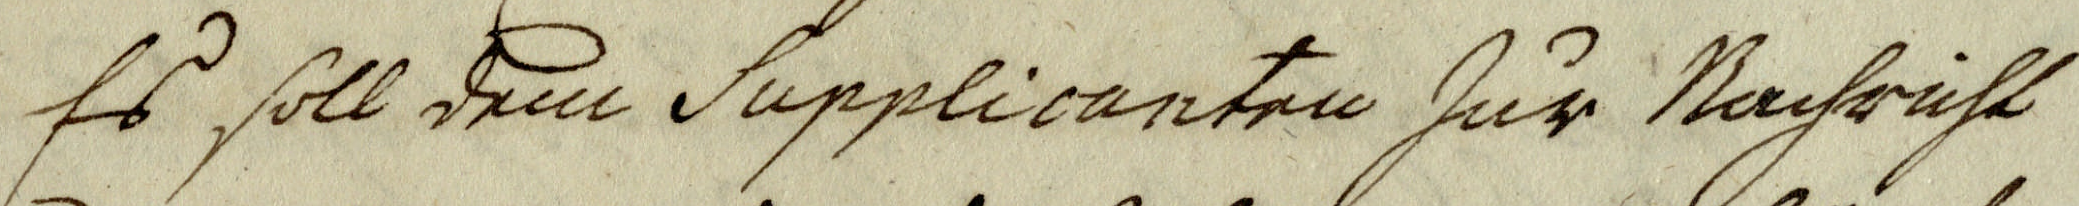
Es soll dem Supplicanten zur Nachricht
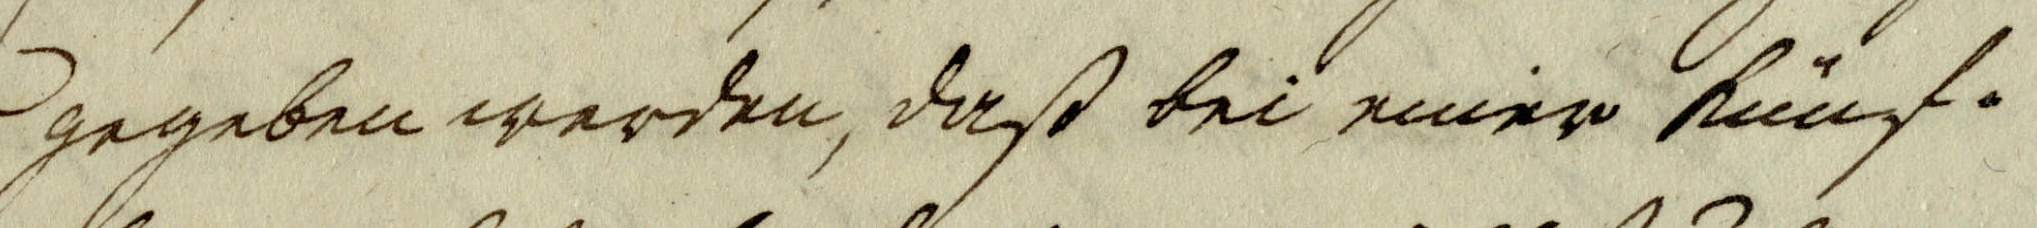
gegeben werden, daß bei einer künf¬
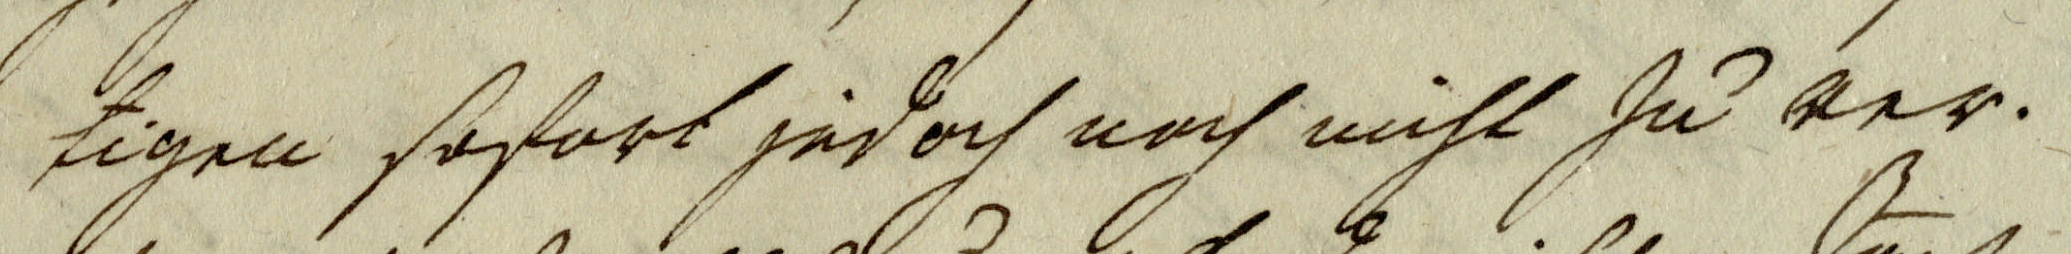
tigen sofort jedoch noch nicht zu ver¬
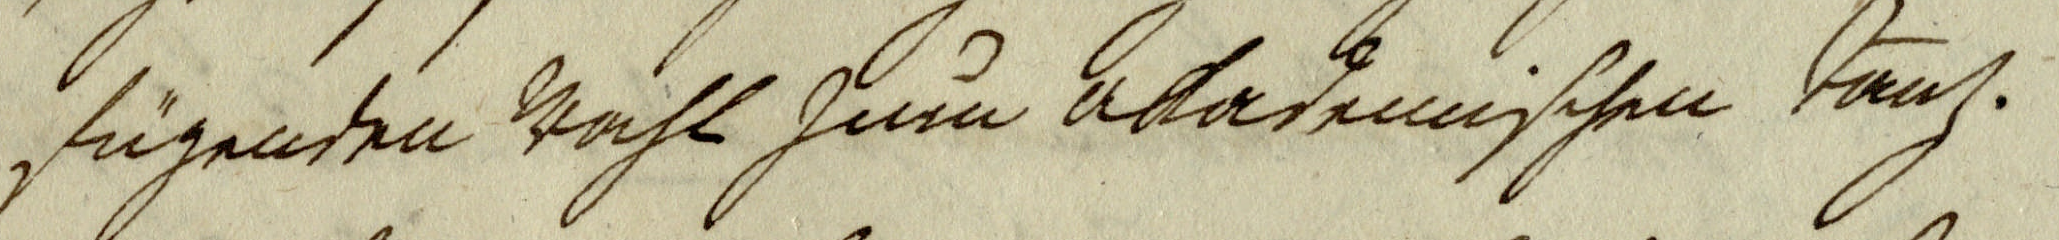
fügenden Wahl zum akademischen Tanz¬
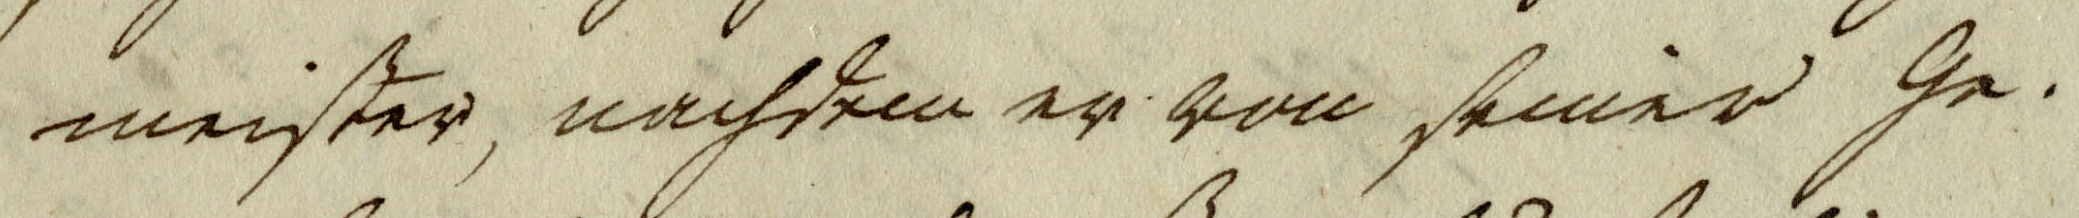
meister, nachdem er von seiner Ge¬
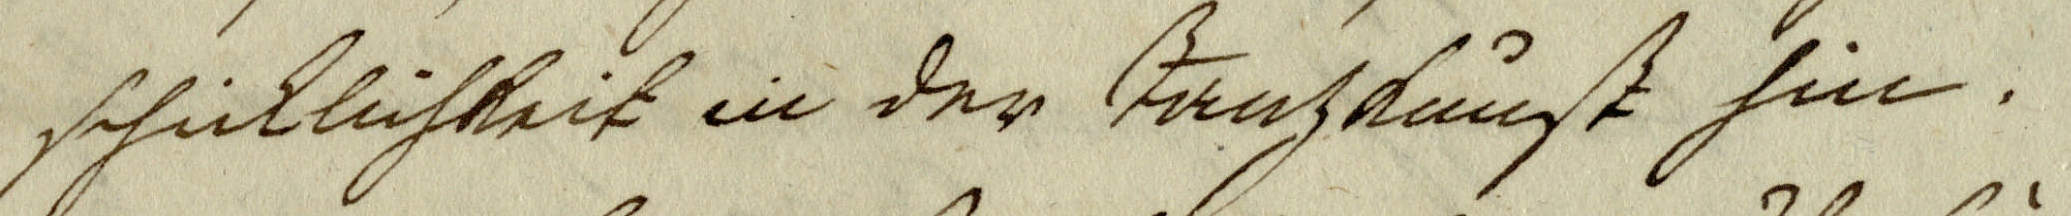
schicklichkeit in der Tanzkunst hin¬
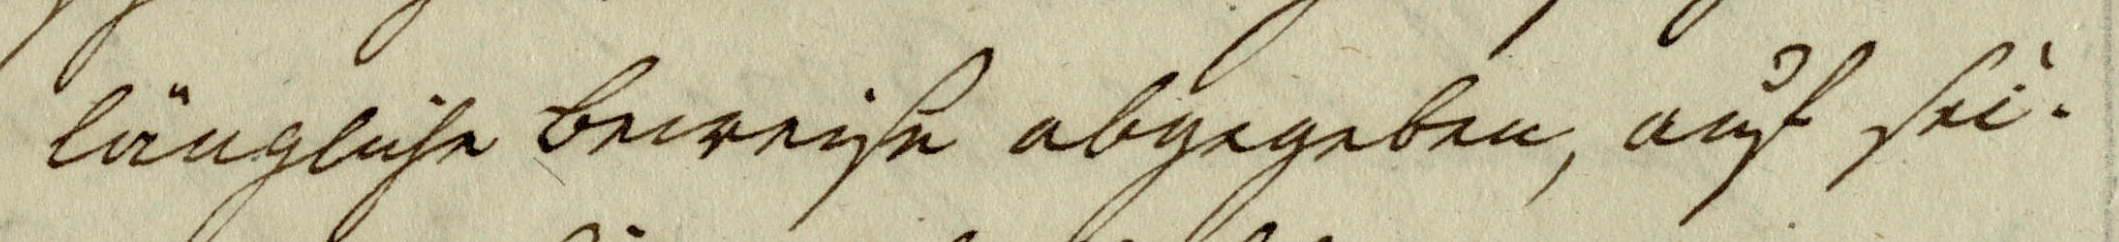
längliche Beweise abgegeben, auf sei¬
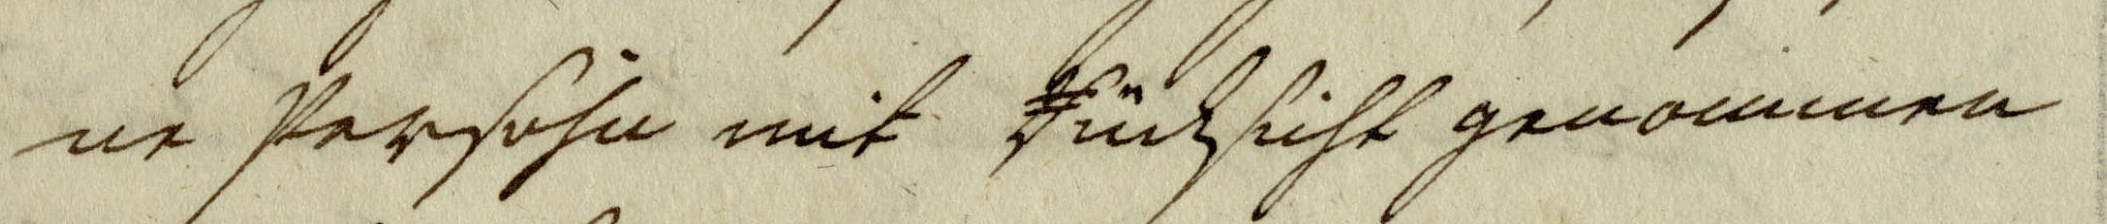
ne Persohn mit Rücksicht genommen
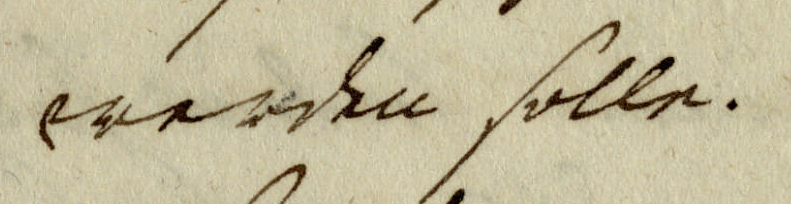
werden solle.
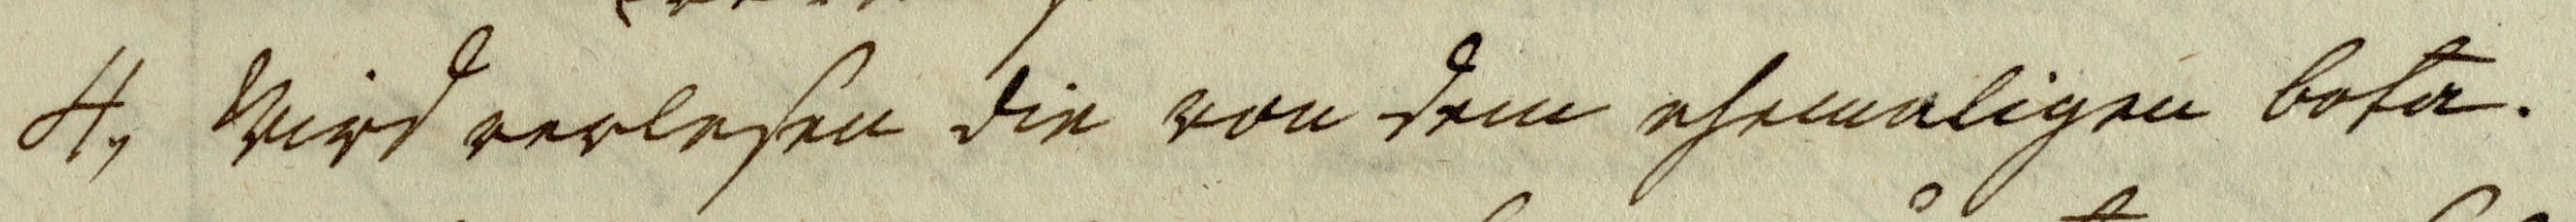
4., Wird verlesen die von dem ehemaligen bota¬
